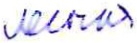лесная
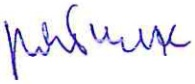рябчик
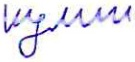кулик
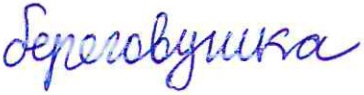береговушка
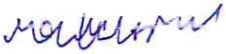маильри
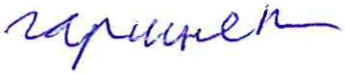гаршнеп
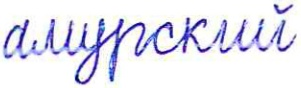амурский
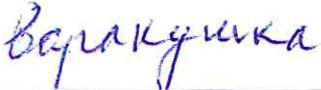варакушка
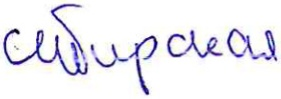сибирская
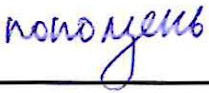поползень
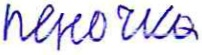пеночка
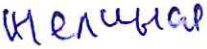желчная
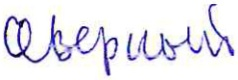северный
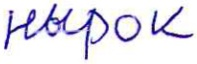нырок
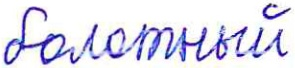болотный
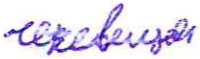чечевица
